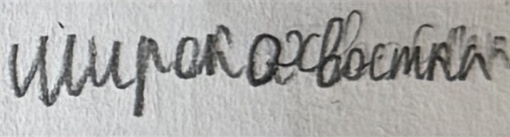широкохвостка
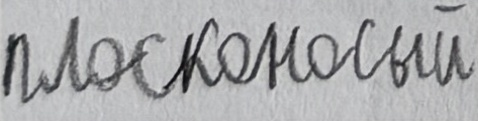плосконосый
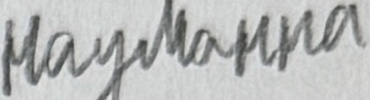науманна
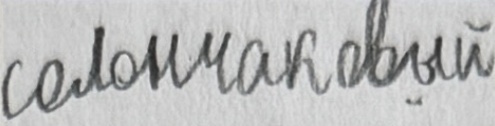солончаковый
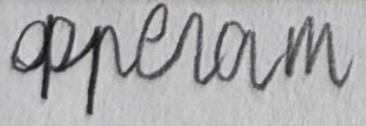фрегат
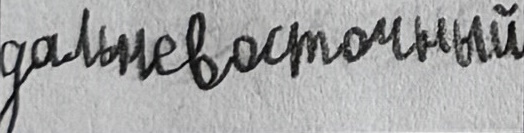дальневосточный
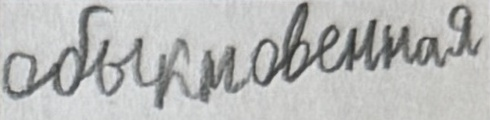обыкмовенная
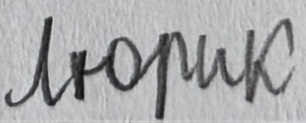люрик
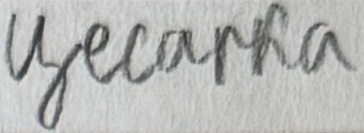цесарка
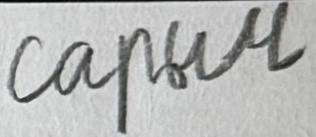сарыч
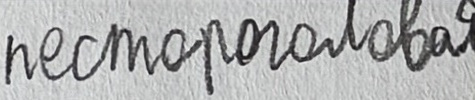пестороголовая
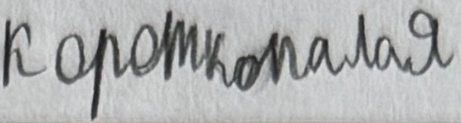короткопалая
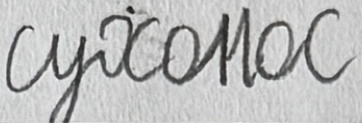сухонос
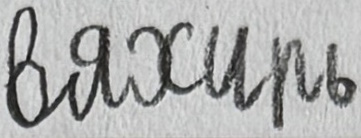вяхирь
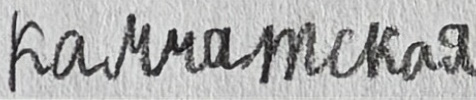камчатская
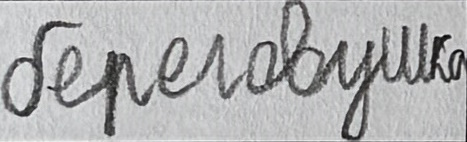береговушка
